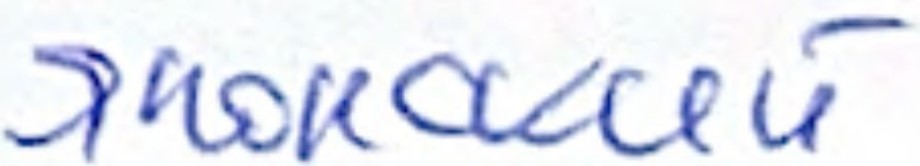японский
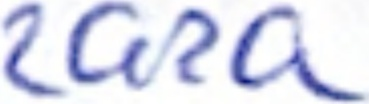гага
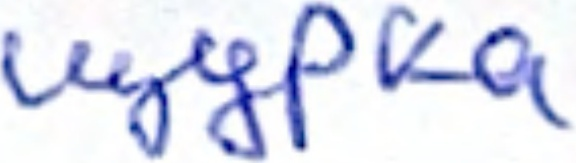щурка
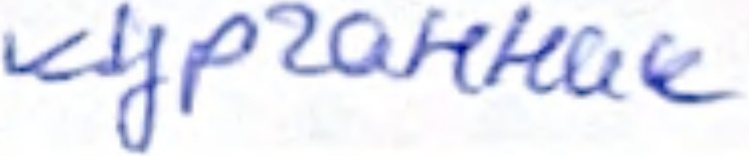курганник
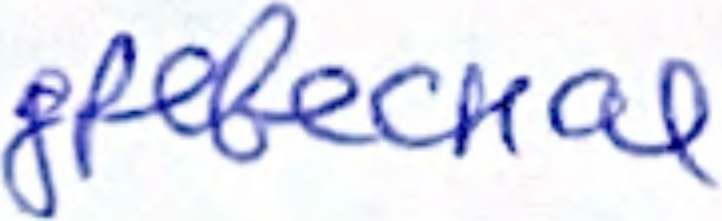древесная
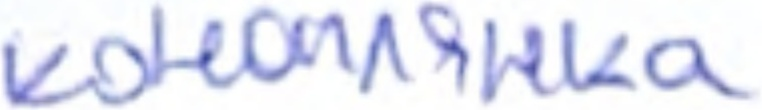коноплянка
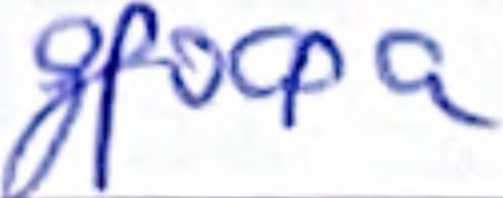дрофа
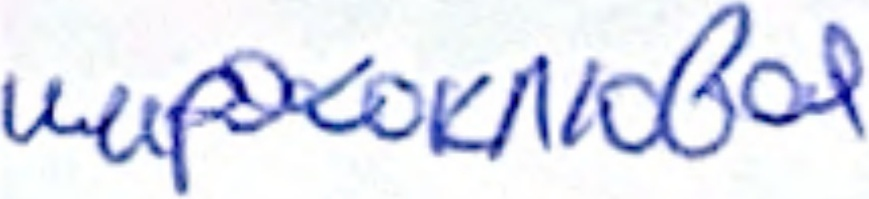ширококлювая
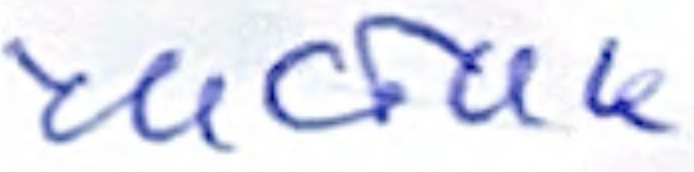чистик
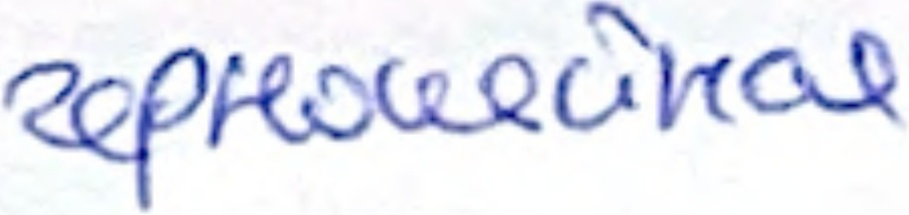черношейная
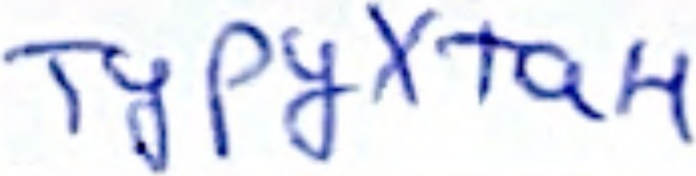турухтан
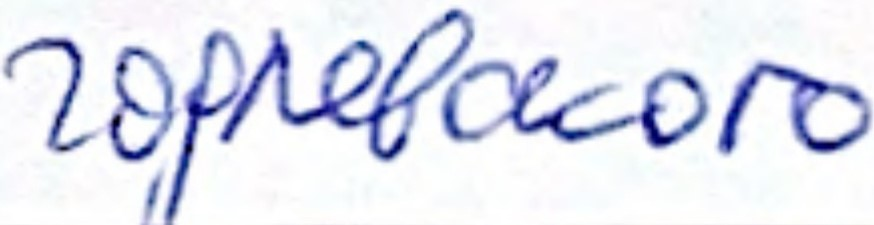годлевасого
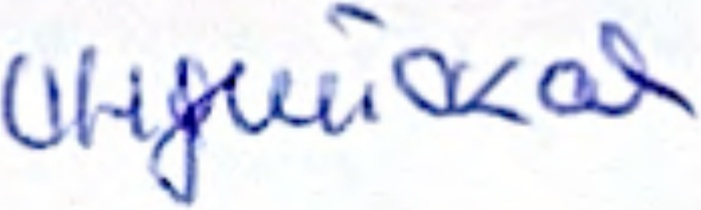индийская
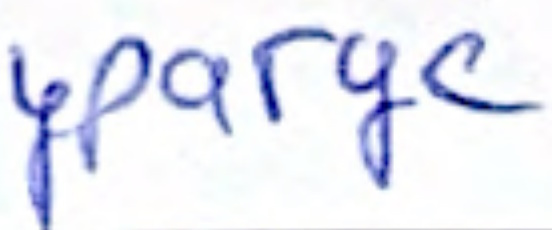урагус
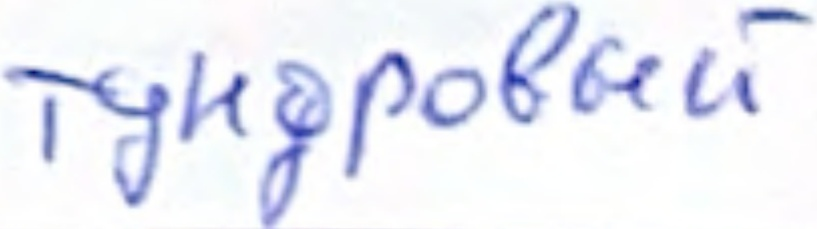тундровый
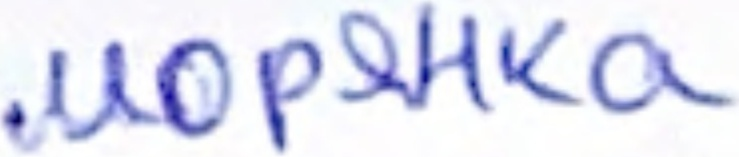морянка
